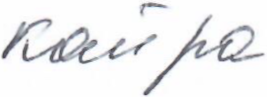кайра
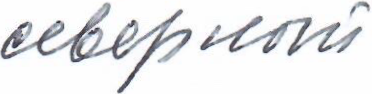северный
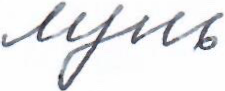лунь
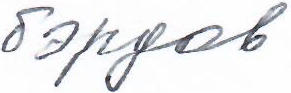бэрдов
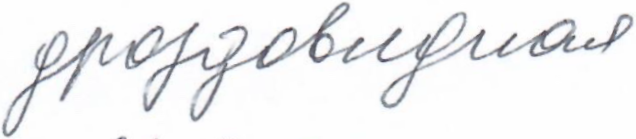дроздовидная
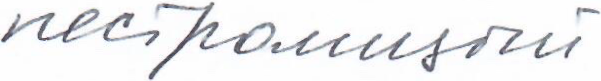пестролицый
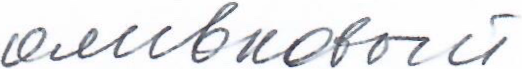оливковый
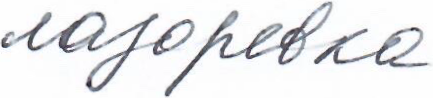лазоревка
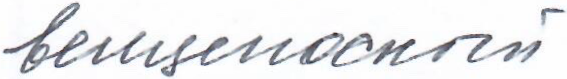венценосный
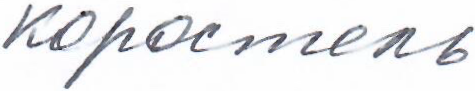коростель
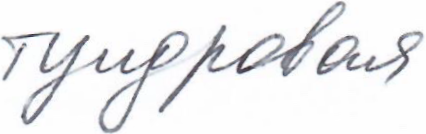тундровая
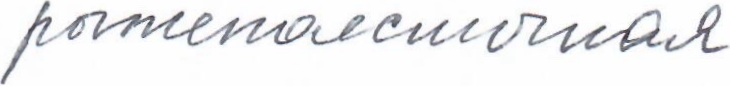рыжепоясничная
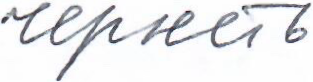чернеть
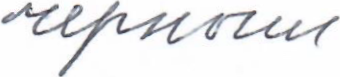черныш
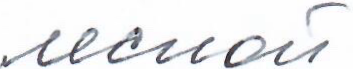лесной
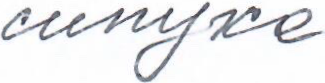сипуха
